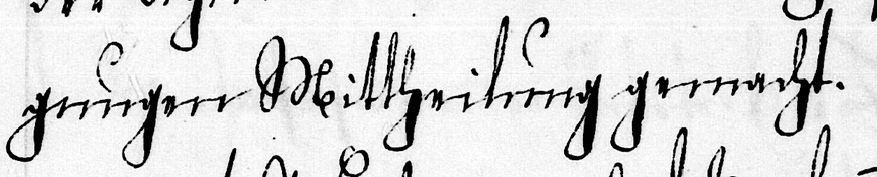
gungen Mittheilung gemacht.
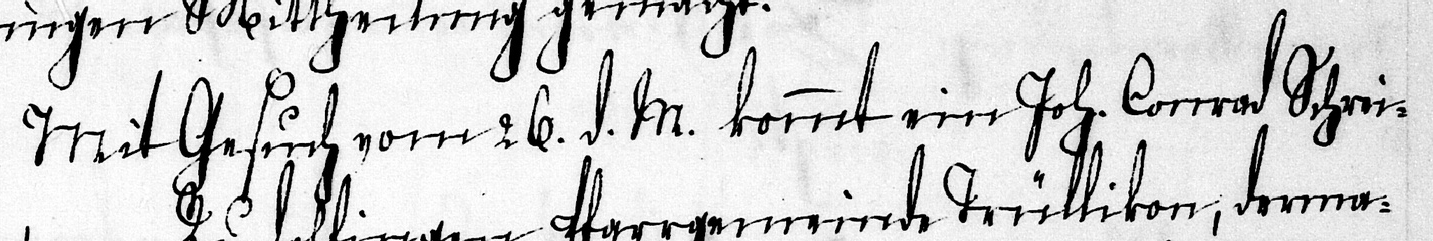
Mit Gesuch vom 26. d. M. kommt ein Joh. Conrad Schrei¬
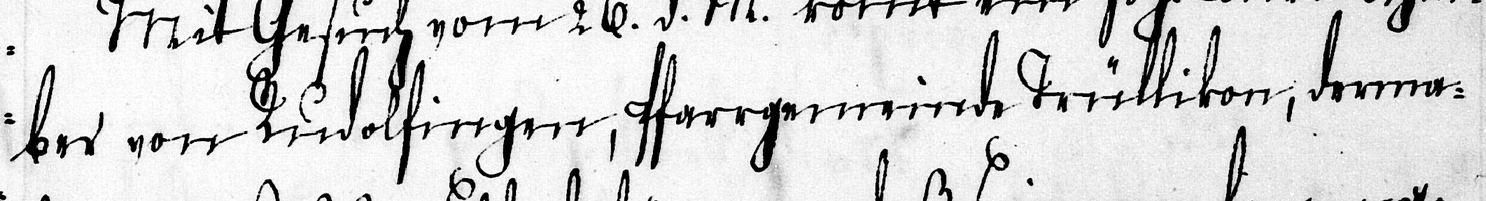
ber von Rudolfingen, Pfarrgemeinde Trüllikon, derma¬
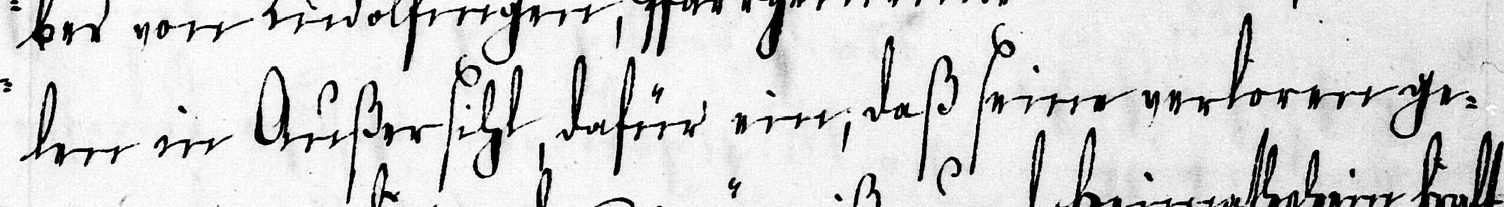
len in Außersihl, dafür ein, daß seine verloren ge¬
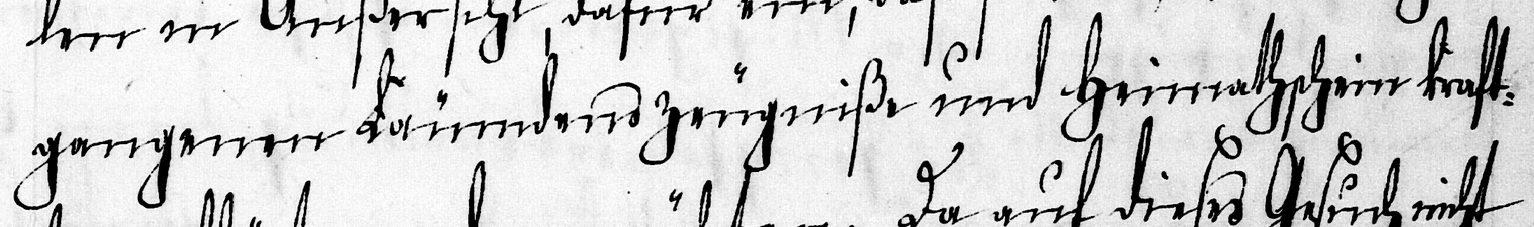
gangenen Leumdenszeugniße und Heimathschein kraf¬
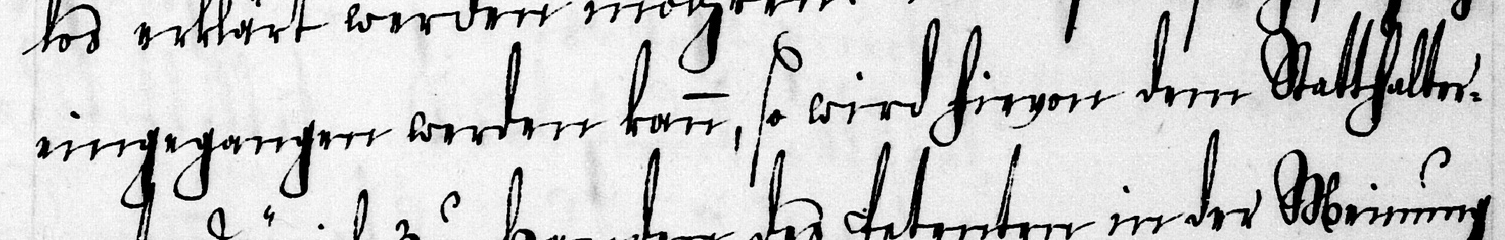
eingegangen werden kann, so wird hiervon dem Statthalt¬
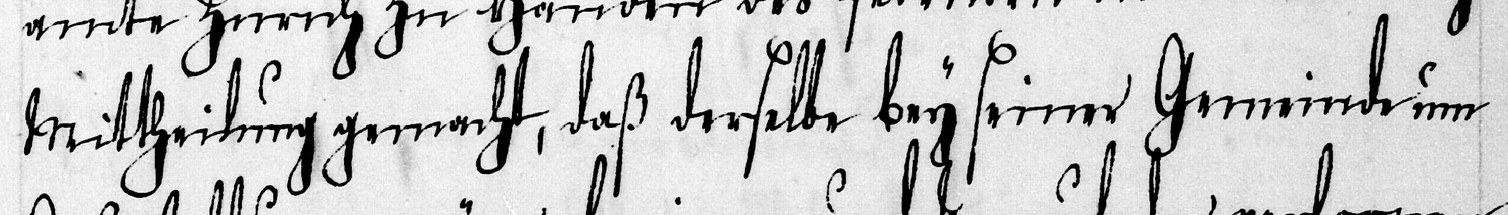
Mittheilung gemacht, daß derselbe bey seiner Gemeinde um
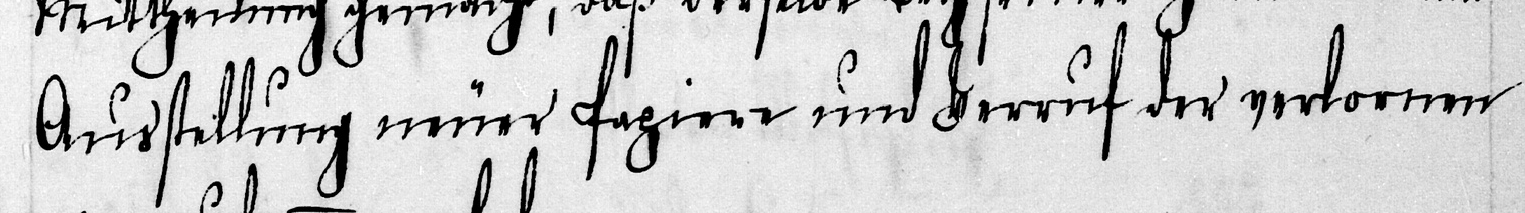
Ausstellung neuer Papiere und Verruf der verlorenen
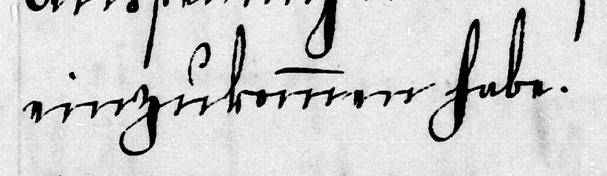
einzukommen habe.
